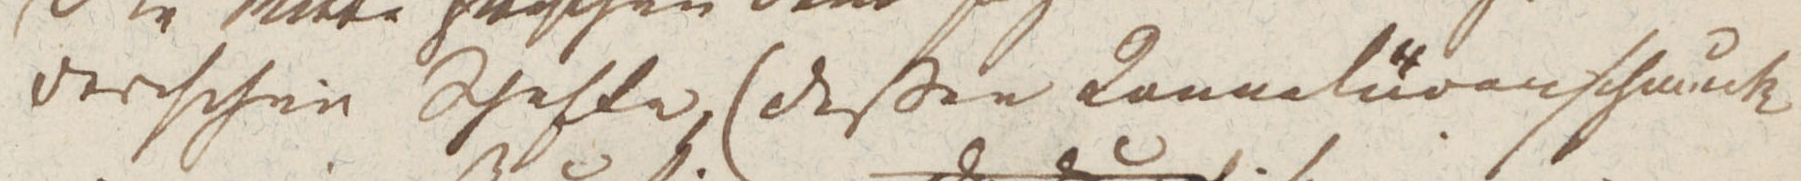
dorischen Schafte, (dessen Kanneluürenschmuck
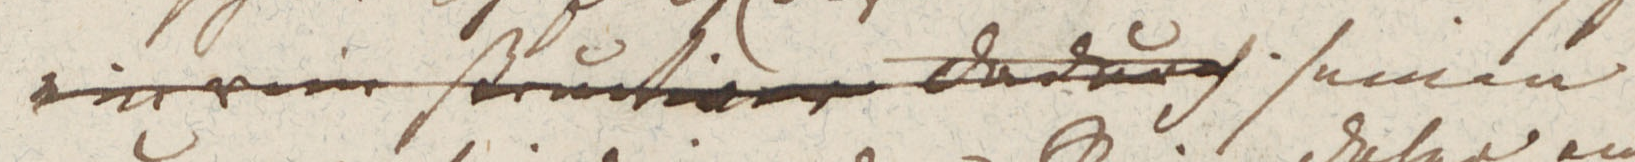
ein rein structiver dadurch seinen
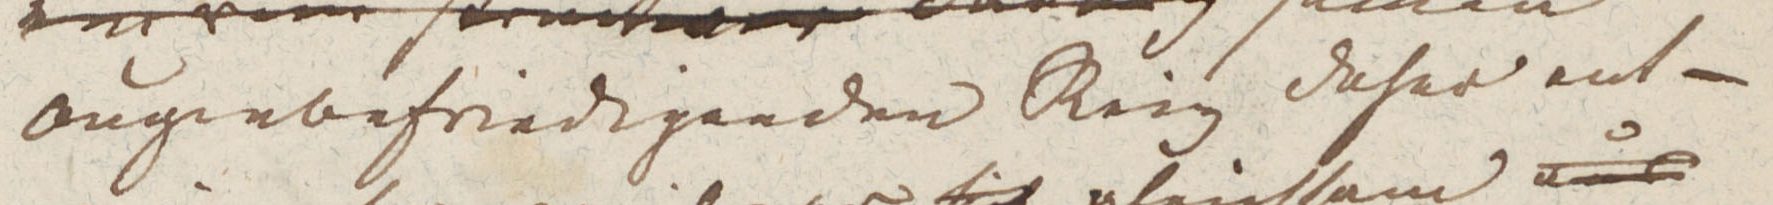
augenbefriedigenden Reiz daher ent-
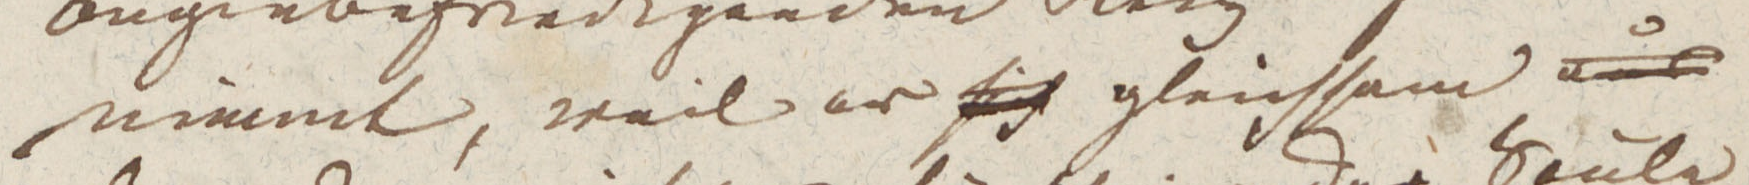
nimmt, weil er sich gleichsam aus
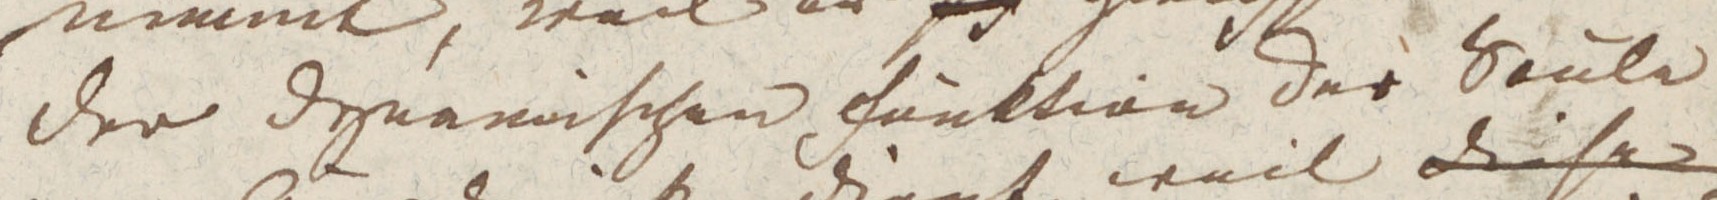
der dynamischen Funktion der Säule
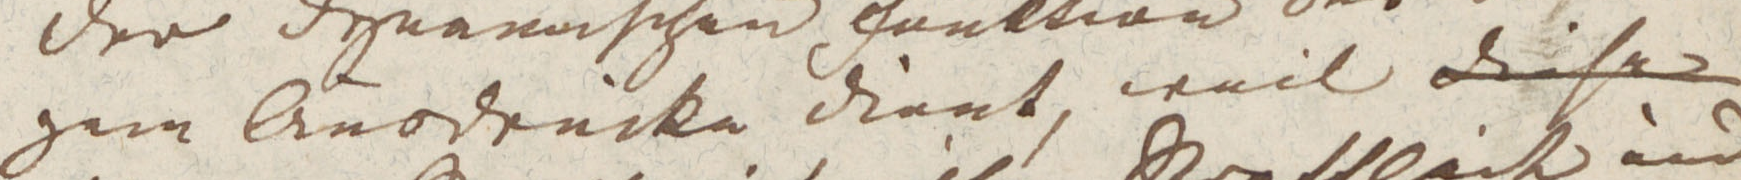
zum Ausdrucke dient, weil diese
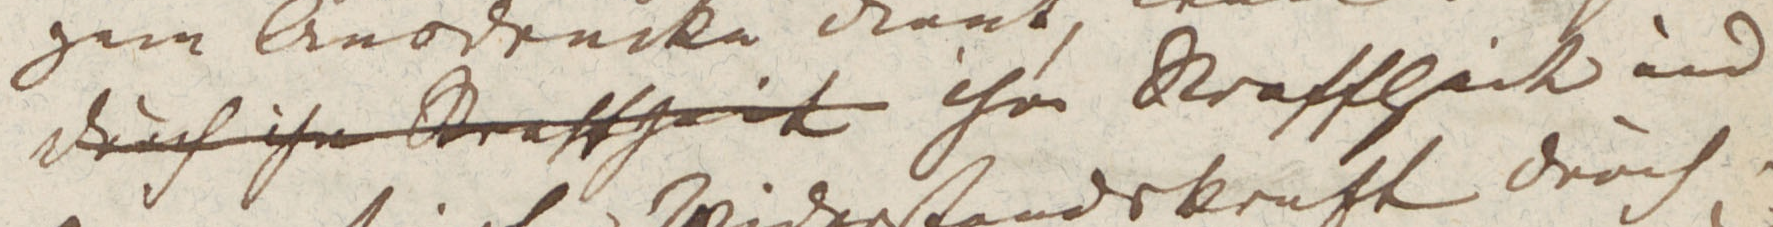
durch ihr Straffheit ihre Straffheit und
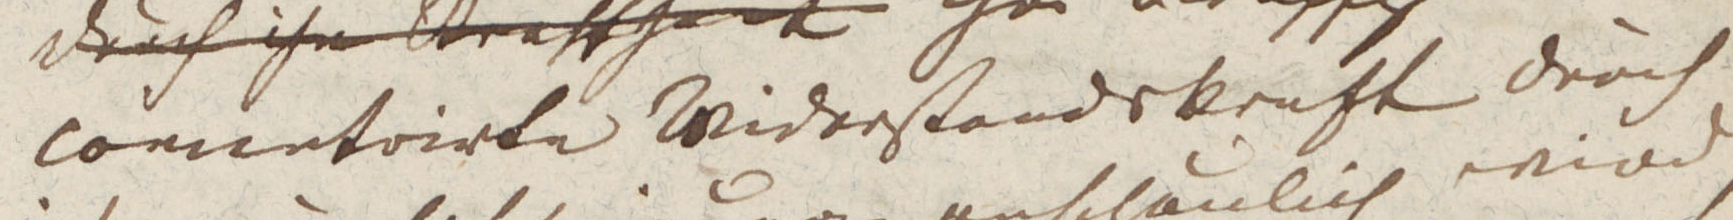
concentrirte Widerstandskraft durch
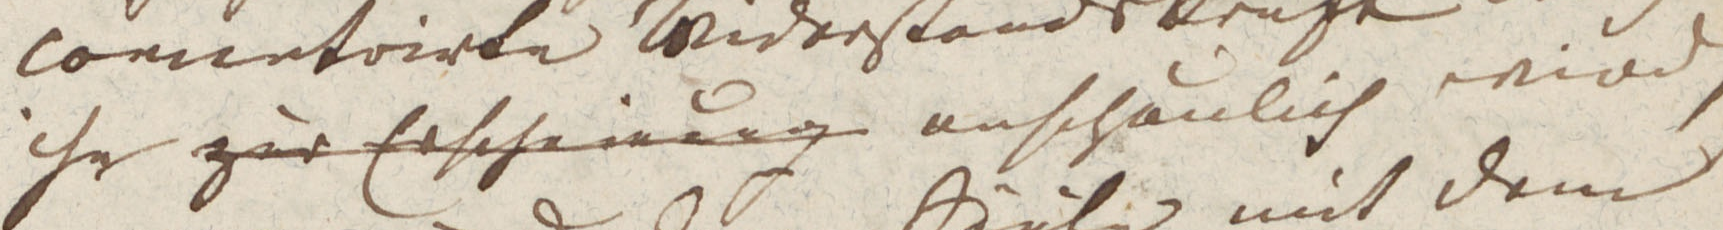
ihn zur Erscheinung anschaulich wird,)
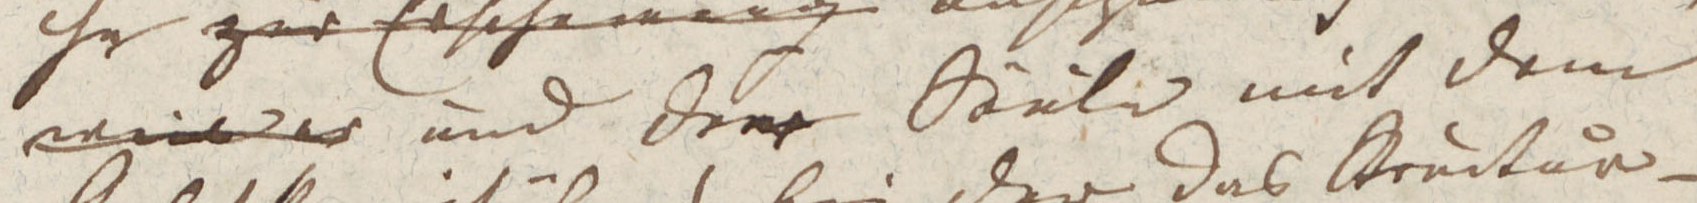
weil er und demr Säule mit dem
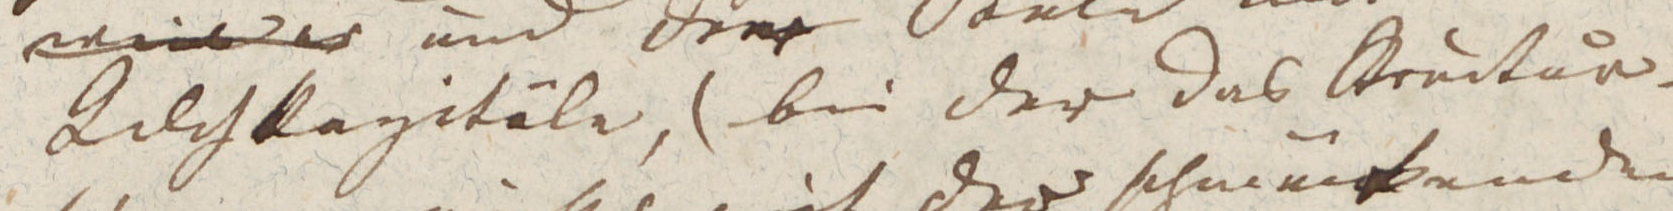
Kelchkapitäle, (bei der das Structur-
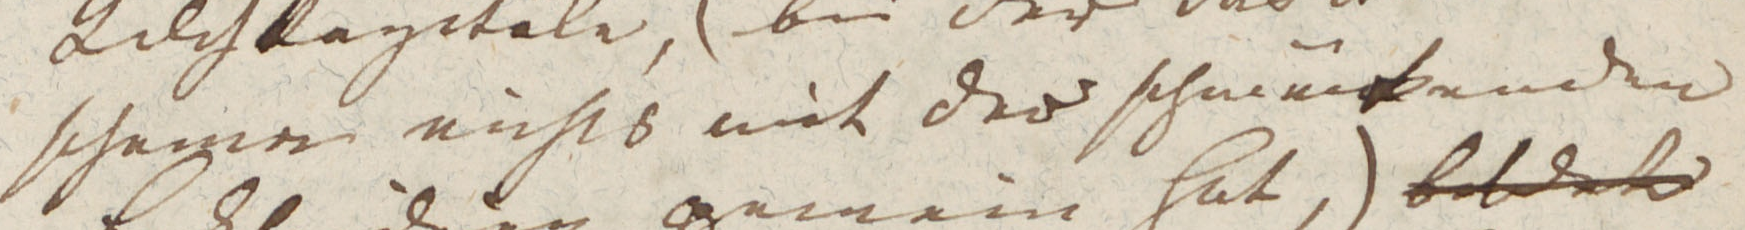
schema nichts mit der schmückenden
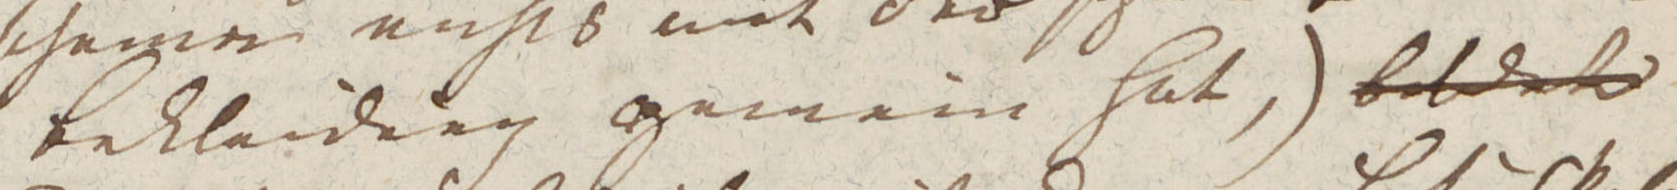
Bekleidung gemein hat,) bildet
